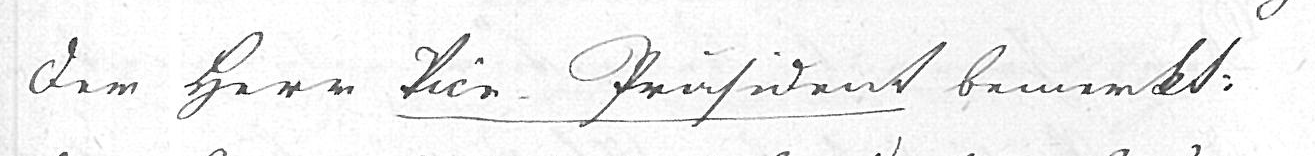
Der Herr Vice-Präsident bemerkt:
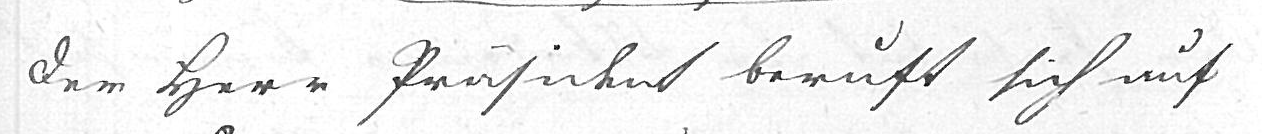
Der Herr Präsident beruft sich auf
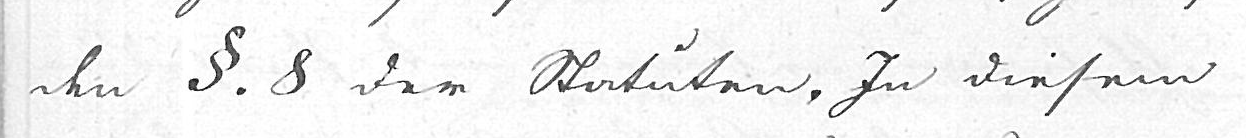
den §. 8 der Statuten. In diesem
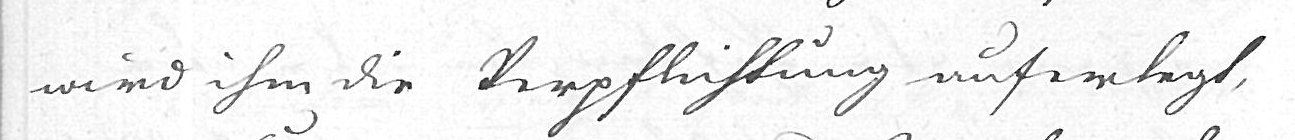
wird ihm die Verpflichtung unterlegt,
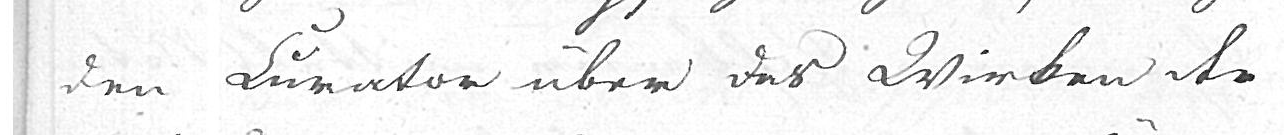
den Curator über das Wirken der
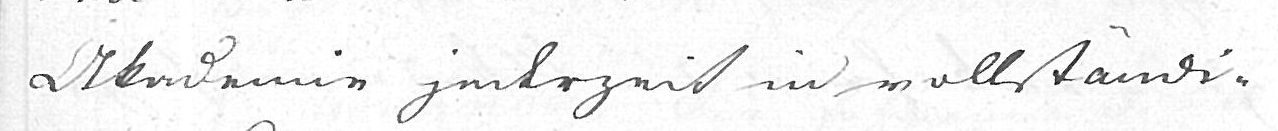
Akademie jederzeit in vollständige-
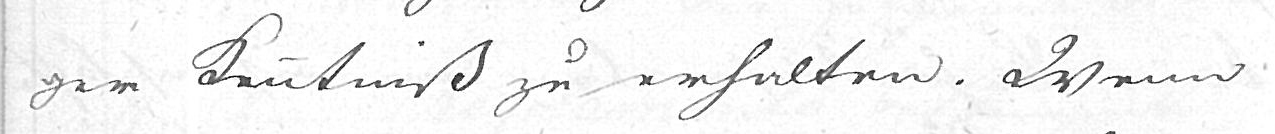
ger Kenntniß zu erhalten. Wenn
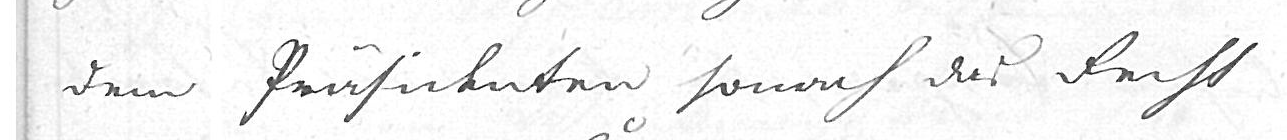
dem Präsidenten sonach das Recht
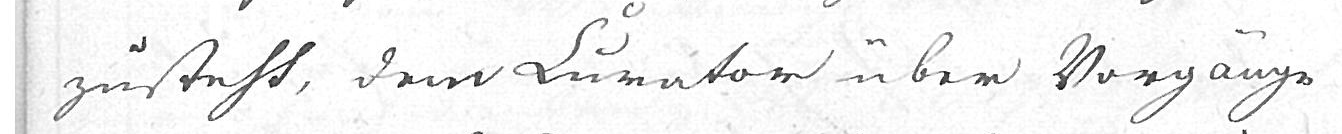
zusteht, dem Curator über Vorgänge
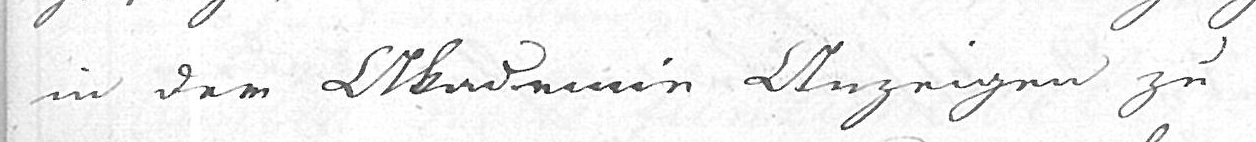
in der Akademie Anzeige zu
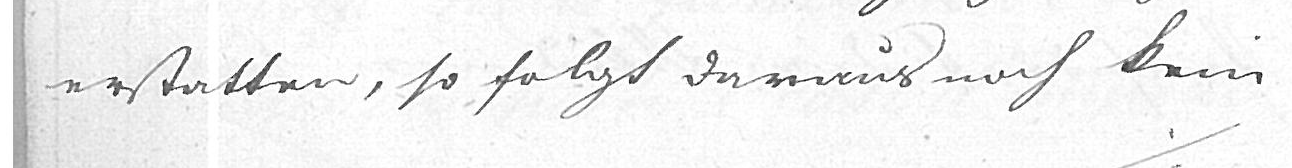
erstatten, so folgt daraus noch kein
